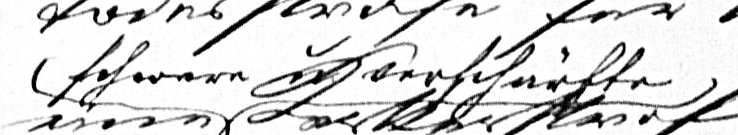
schwere u. verschärfte
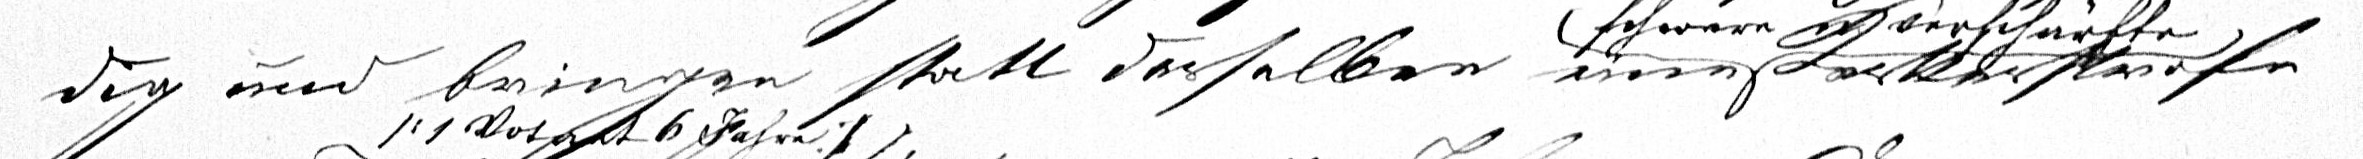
dig und bringen statt derselben eine Kerkerstrafe
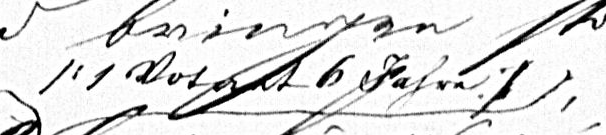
/:1 Votant 6 Jahre:/
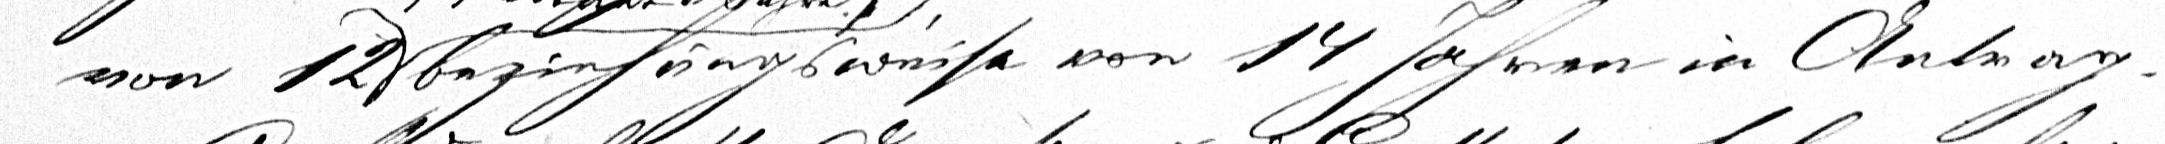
von 12 beziehungsweise von 14 Jahren in Antrag.
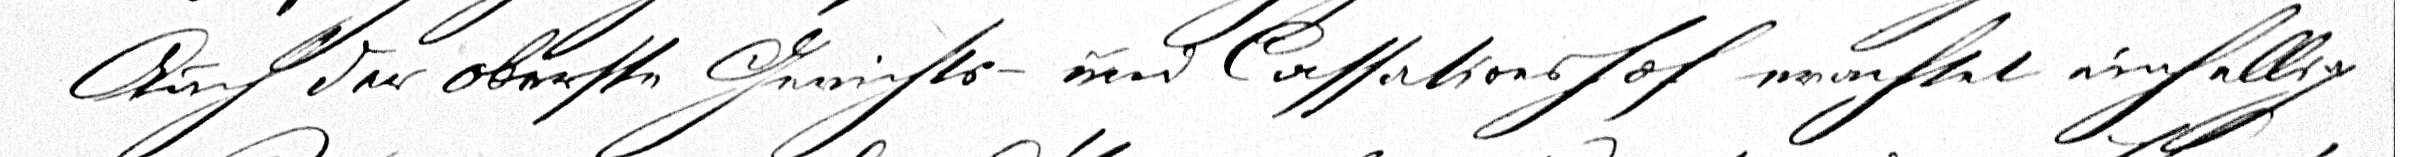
Auch der oberste Gerichts- und Cassationshof erachtet einhellig
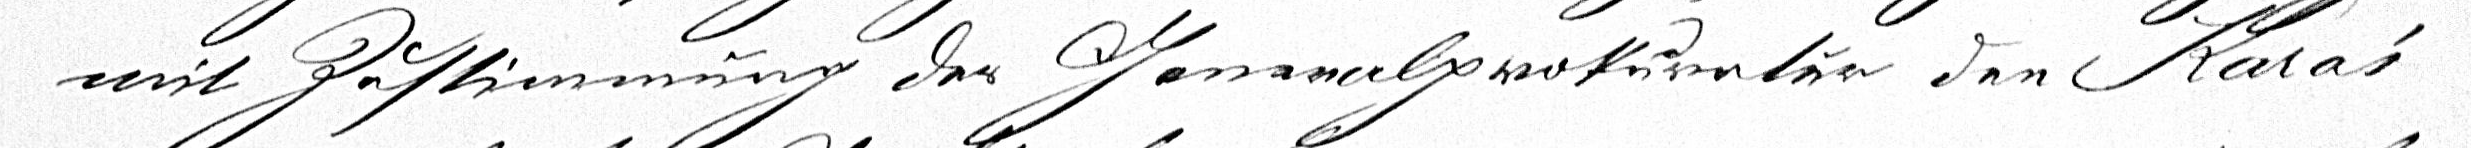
mit Zustimmung der Generalprokuratur den Karaś
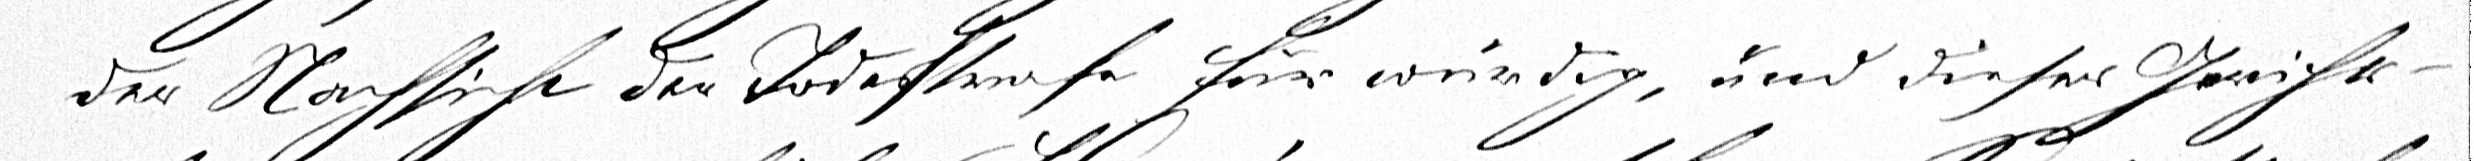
der Nachsicht der Todesstrafe für würdig, und dieser Gerichts¬
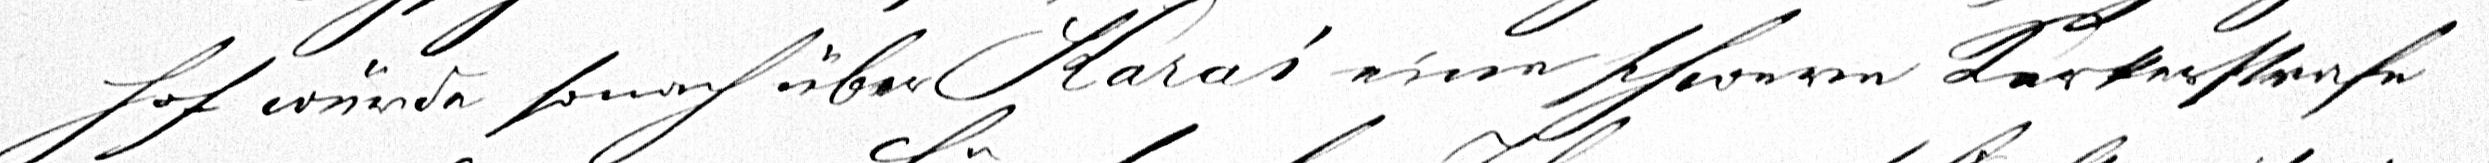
hof wuürde sonach über Karaś eine schweren Kerkerstrafe
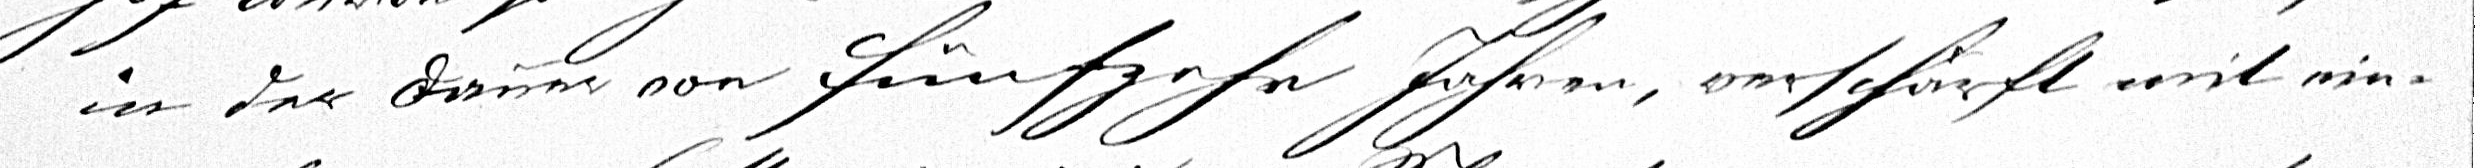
in der Dauer von fünfzehn Jahren, verschärft mit ein
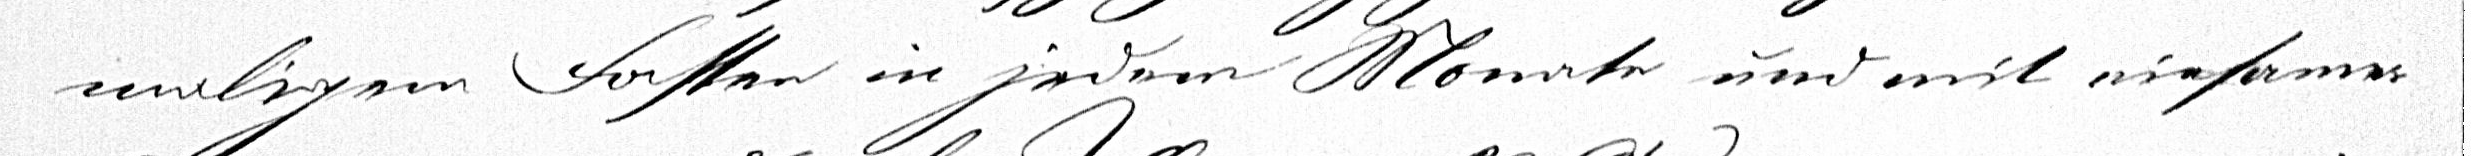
maligem Fasten in jedem Monate und mit einsamer
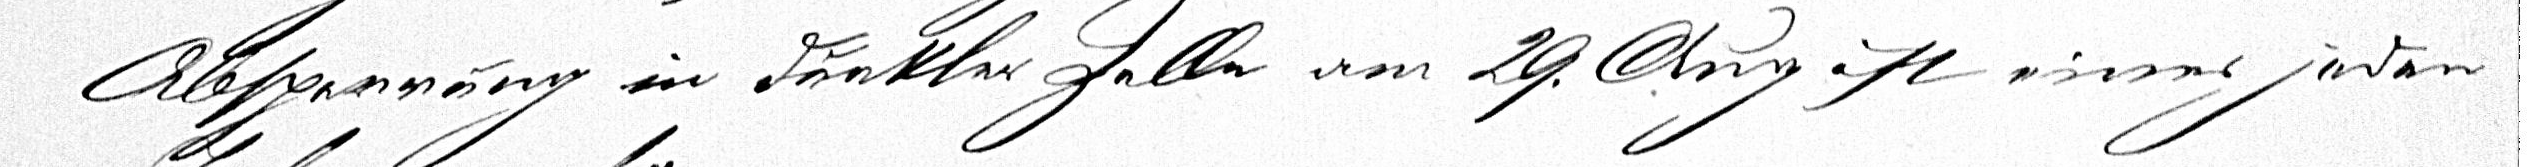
Absperrung in dunkler Zelle am 29 August eines jeden
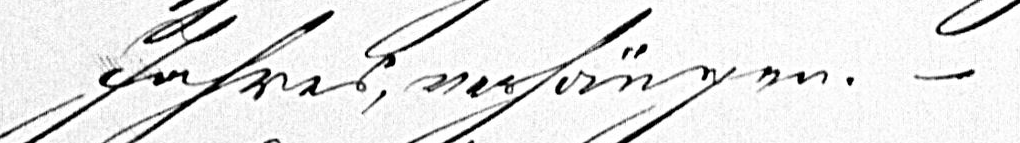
Jahres, verhängen. –
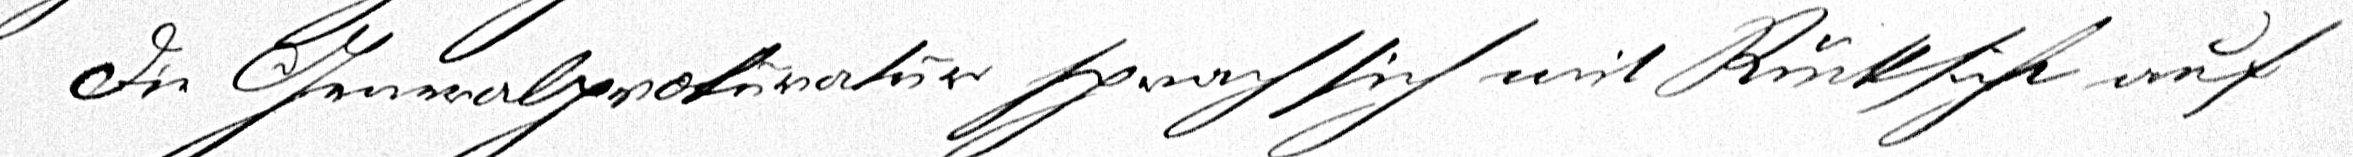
Die Generalprokuratur sprach sich mit Rücksicht auf
